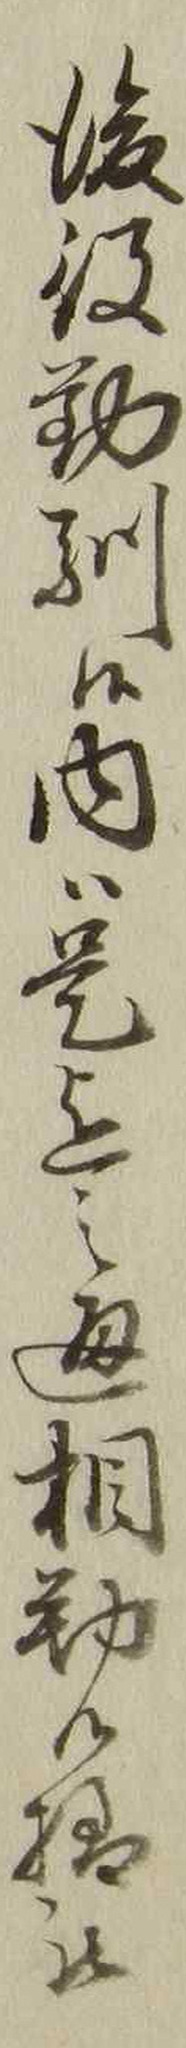後役勤馴候内ハ是迄之通相勤候様被
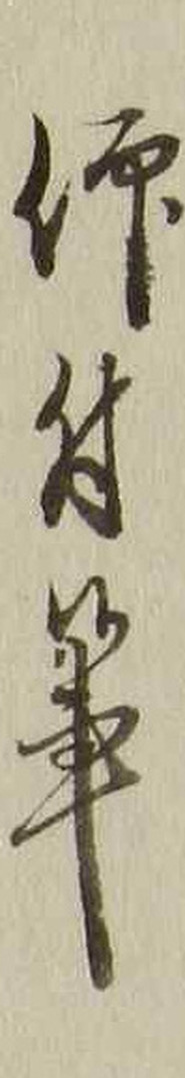仰付候事
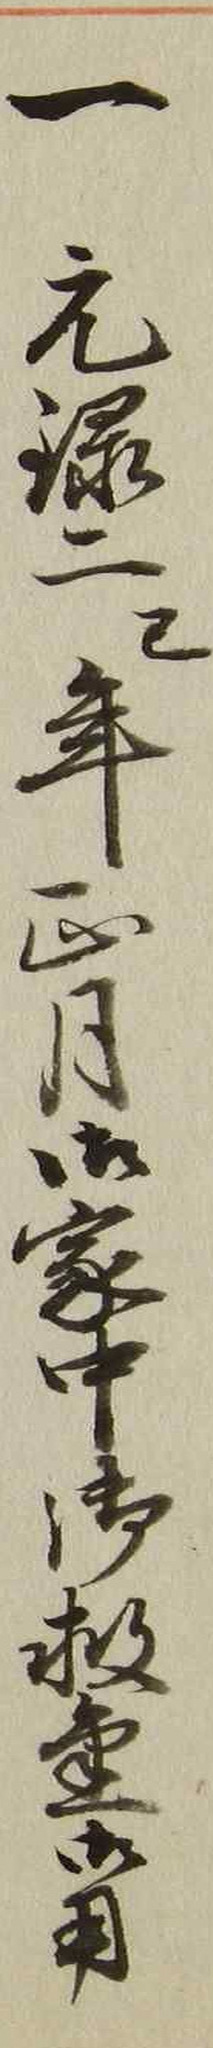一元録二巳年正月御家中御救金御用
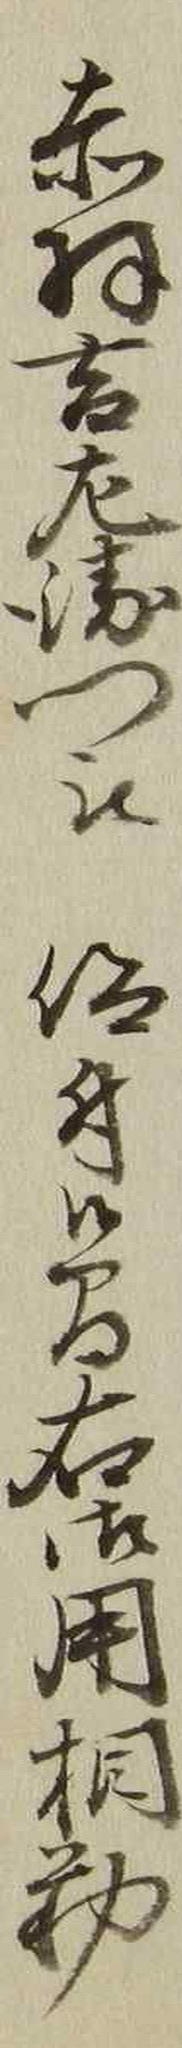赤羽吉左衛門被仰付候間右御用相勤
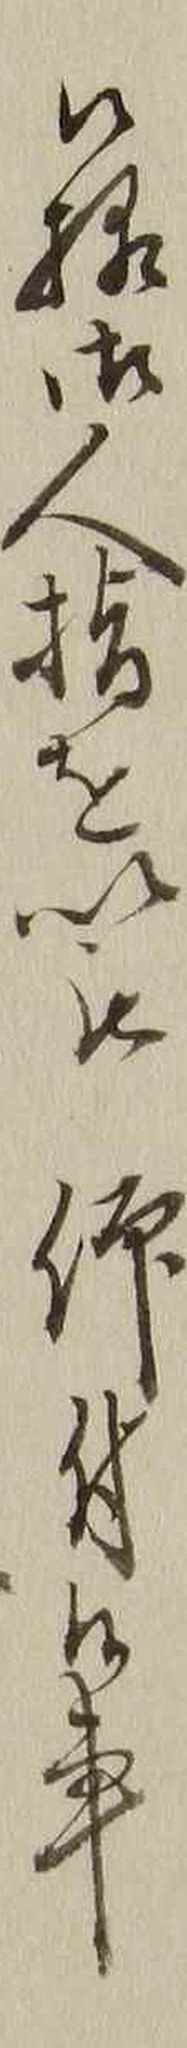候様御人指を以被仰付候事
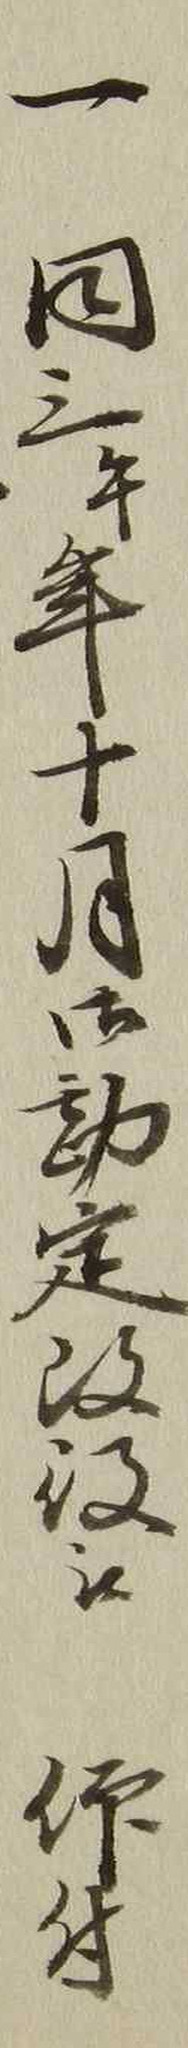一同三午年十月御勘定改役被仰付
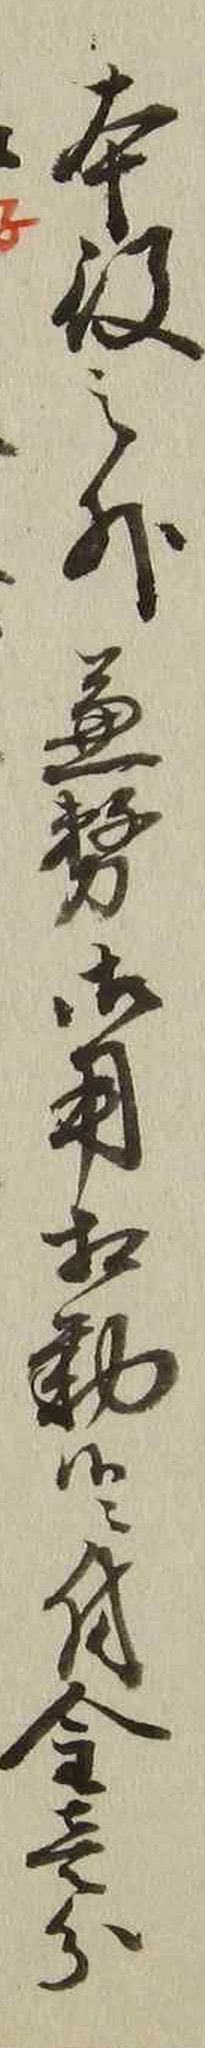本役之外兼務御用相勤候ニ付金壱分
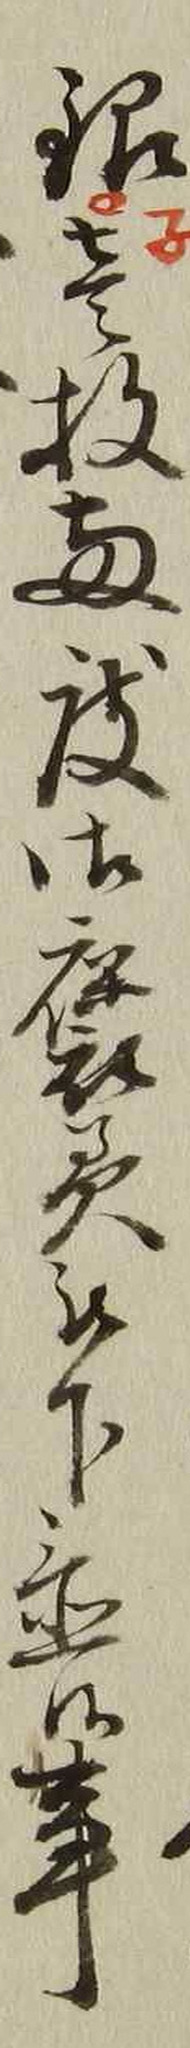銀◦子壱枚両度御褒美被下置候事
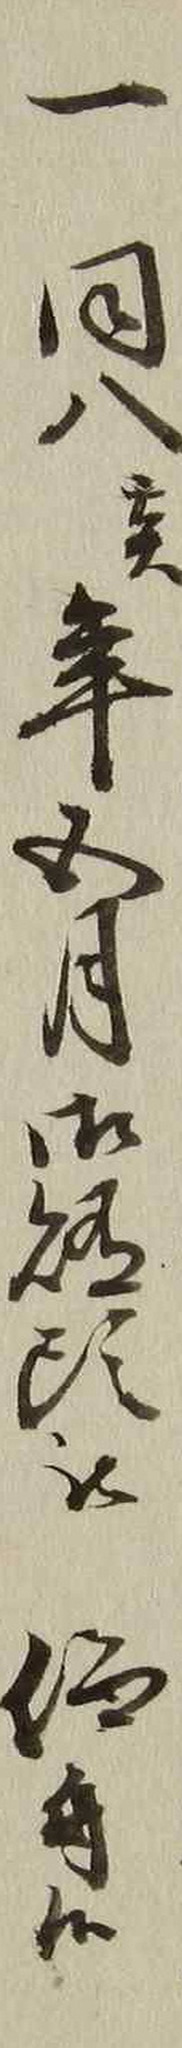一同八亥年五月御賄頭被仰付候
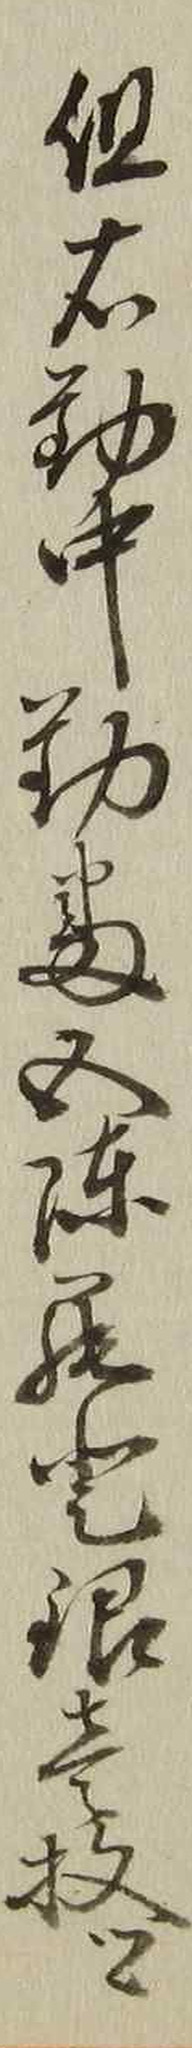但右勤中勤番五陣罷登銀壱枚ツヽ
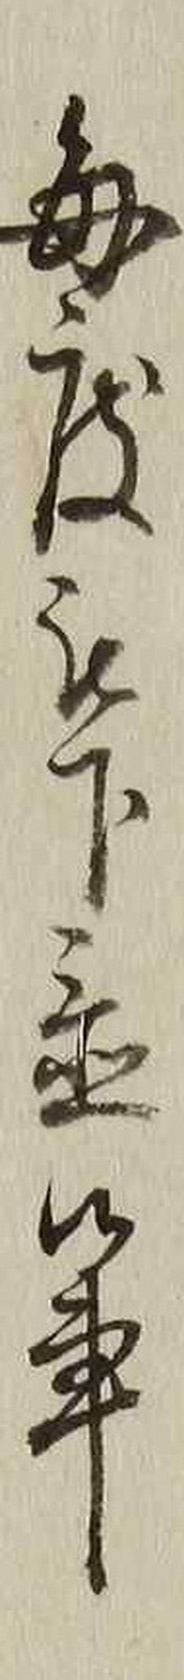毎度被下置候事
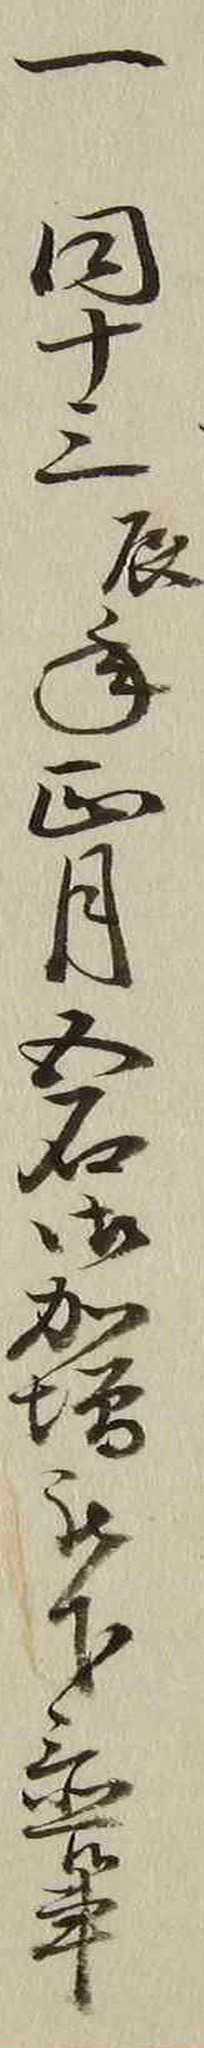一同十三辰年正月五石御加増被下置候事
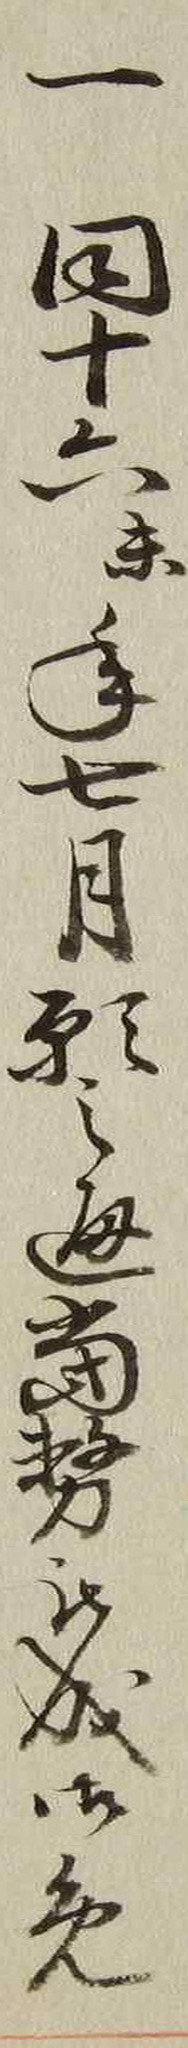一同十六未年七月願之通当務被成御免
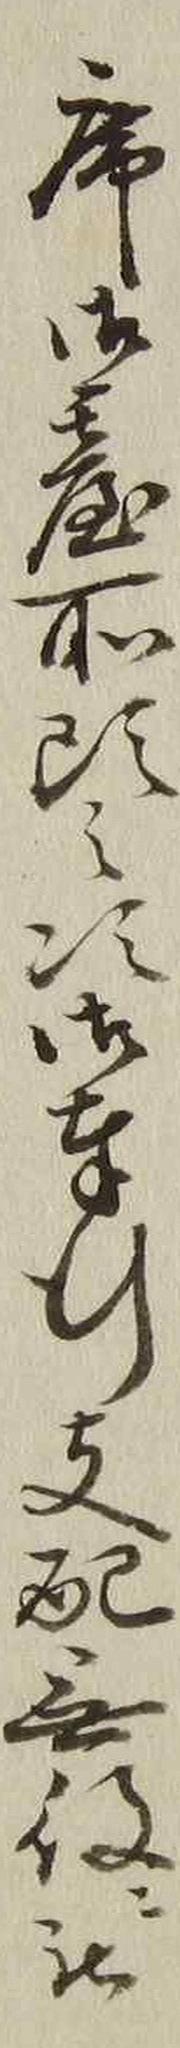席御台所頭之次御奉行支配無役ニ被
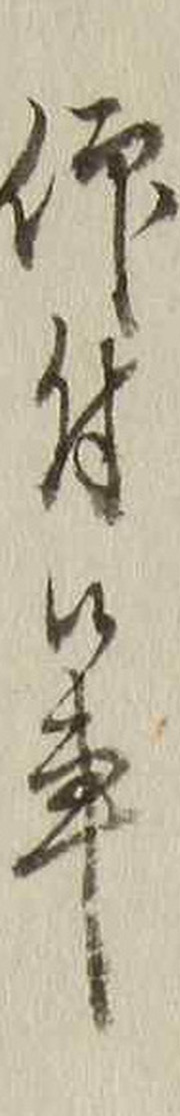仰付候事
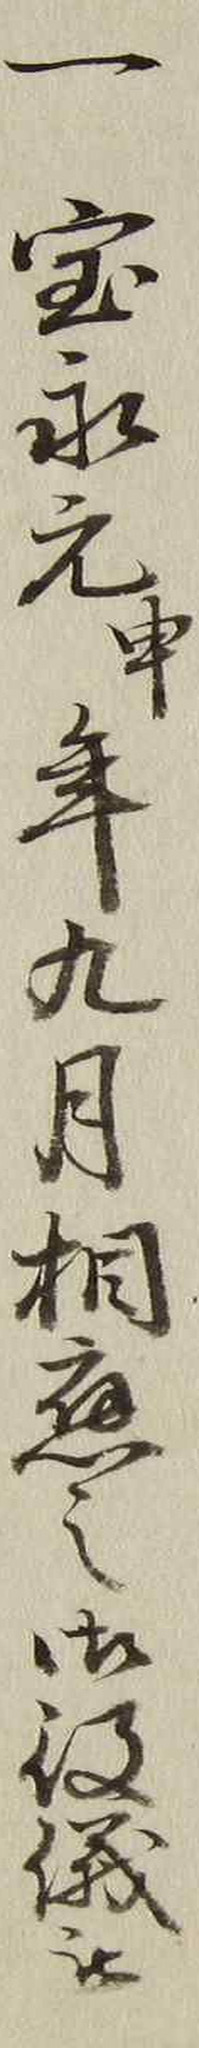一宝永元申年九月相応之御役儀被
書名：諸士系譜　巻之27　い之部27
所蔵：会津若松市立会津図書館
